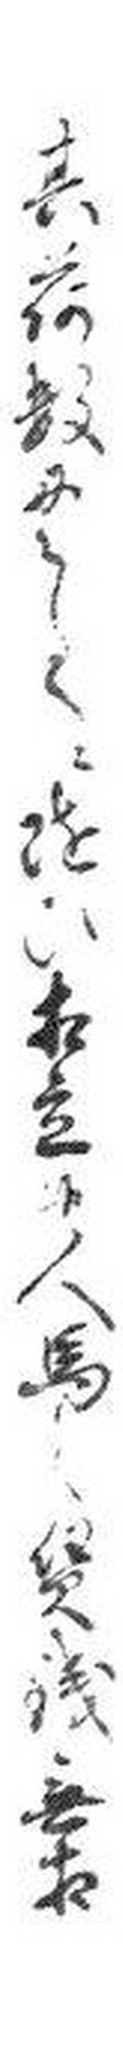其荷数貫匁ニ随ひ相立候人馬之賃銭無相
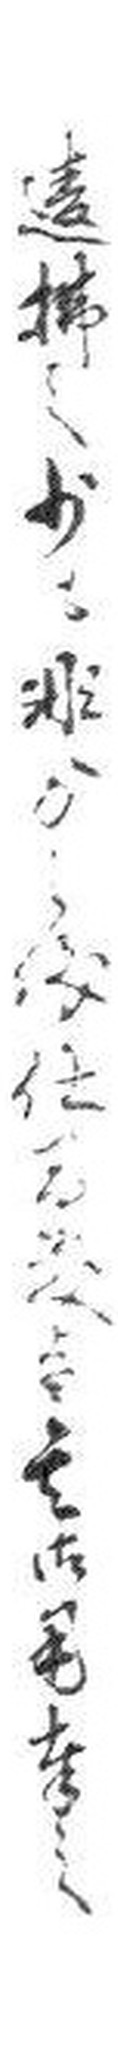違払之少も非分之儀仕間敷旨其御用奉之
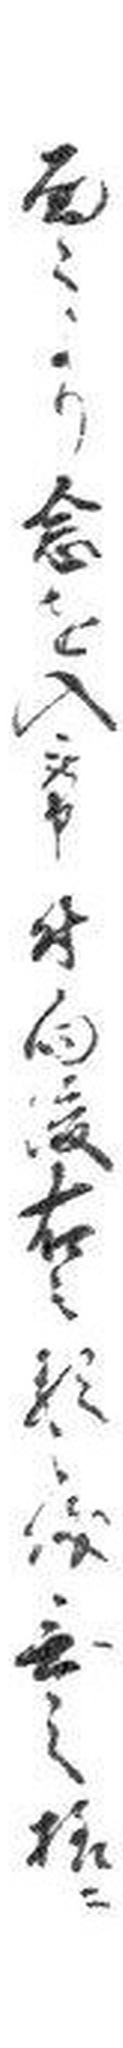面々より念を入被申付向後右之類之儀無之様ニ
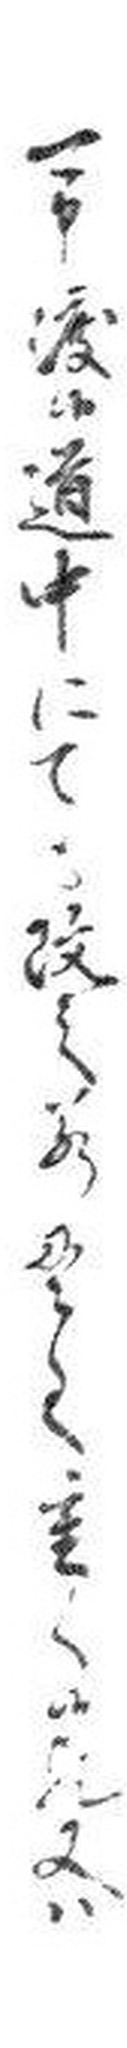可申渡候道中にても改之若貫匁重く候歟又ハ
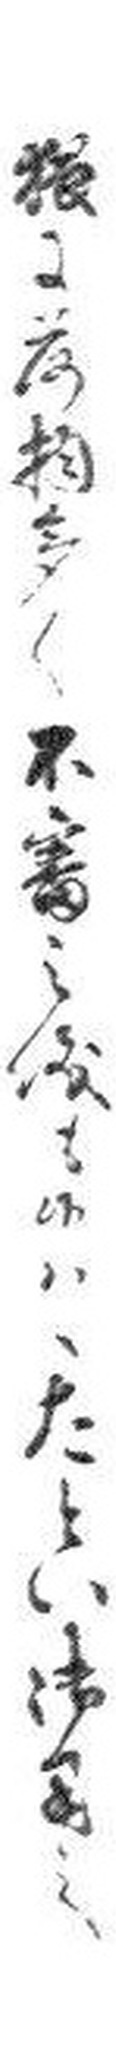猥に荷物多く不審之儀も候ㇵゝたとい御用之
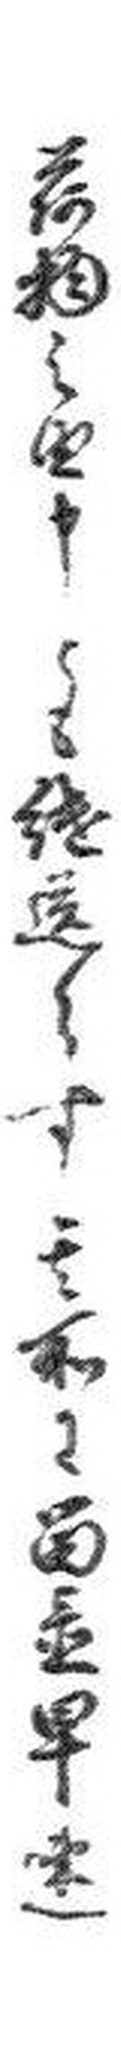荷物之由申とも継送らす其所に留置早速
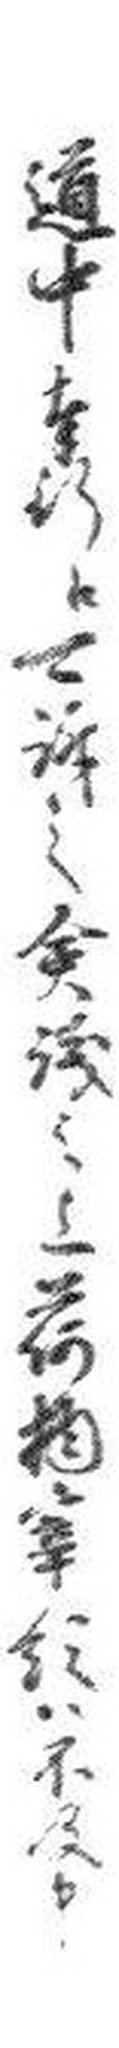道中奉行江可訴之僉議之上荷物宰領ㇵ不及申
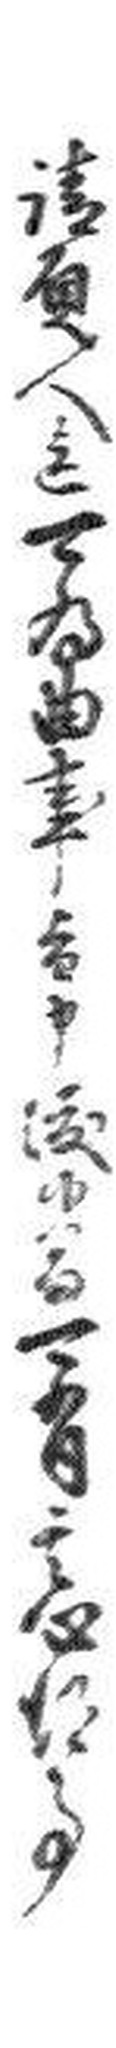請負人迄可為曲事旨申渡候間可有其心得事
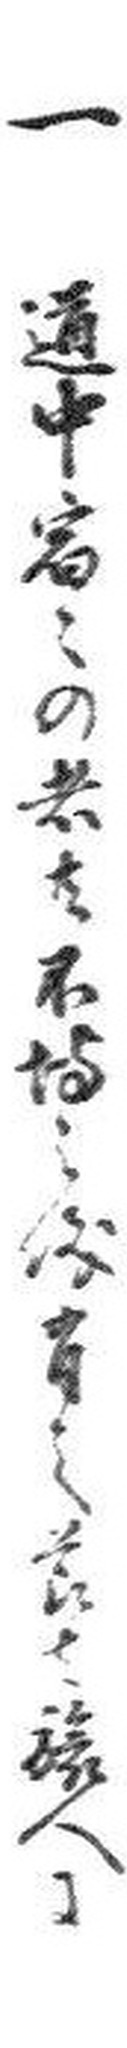一道中宿々の者共不埒之儀有之節者旅人に
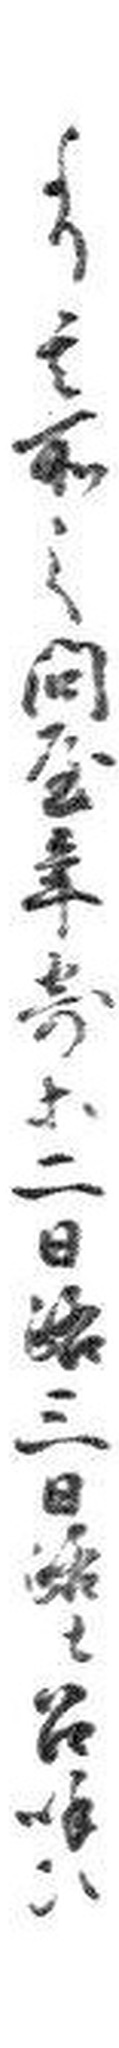より其所之問屋年寄等二日路三日路も召呼ひ
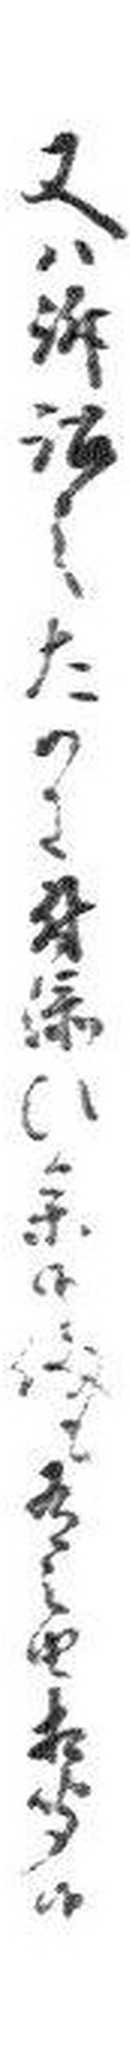又ハ訴訟之ために付添ひ参候儀も有之由相聞候
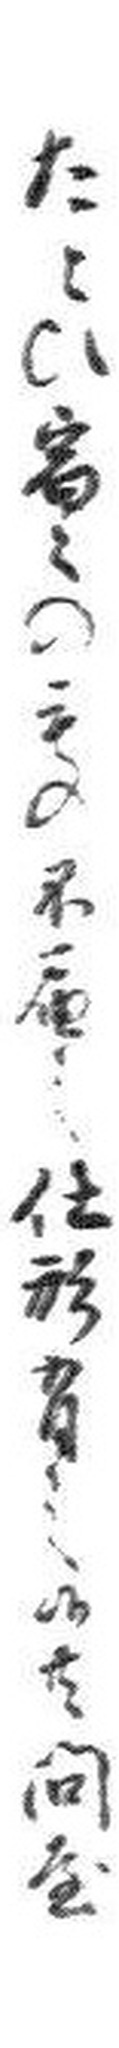たとひ宿々のもの不届之仕形有之候共問屋
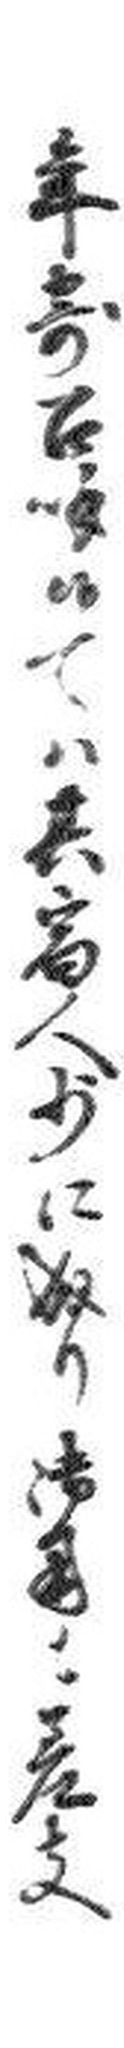年寄召呼候てハ其宿人少に成り御用も差支
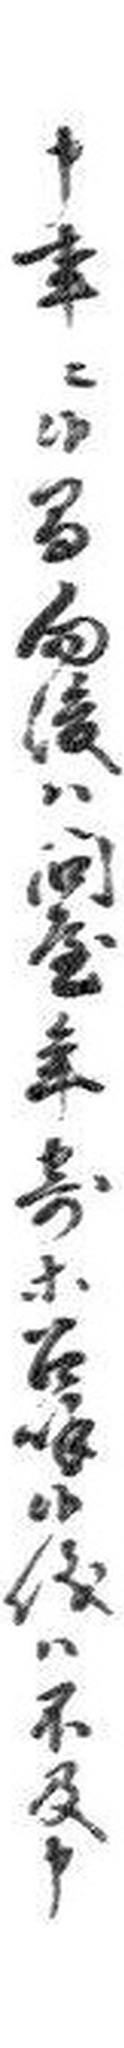申事ニ候間向後ㇵ問屋年寄等召呼候儀ハ不及申

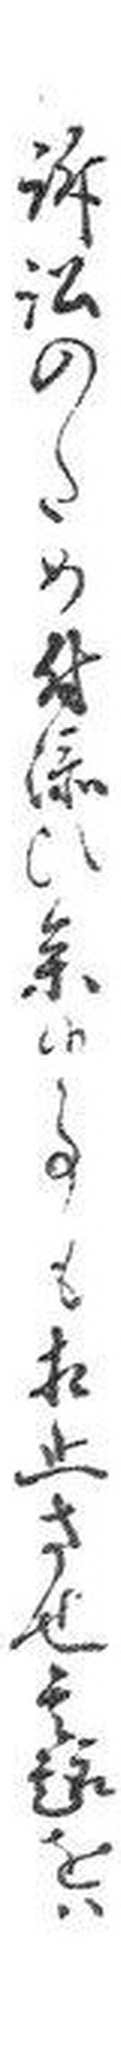訴訟のため付添ひ参候事も相止させ其趣をハ
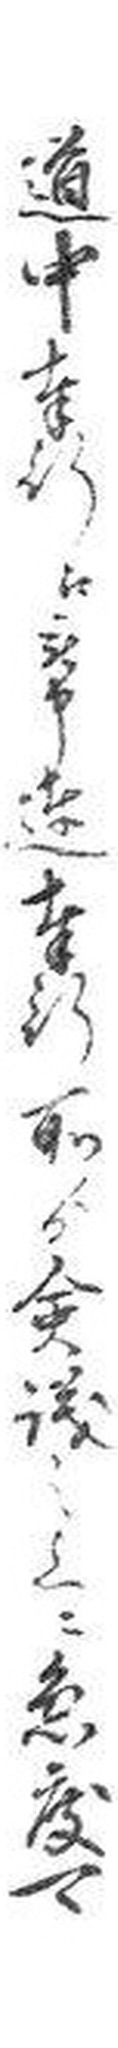道中奉行江被申達奉行所ゟ僉議之上ニ急度可
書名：家譜 二十九 吉邦公 従正徳二年到正徳三年
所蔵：福井県文書館 Fukui Prefectural Archives
